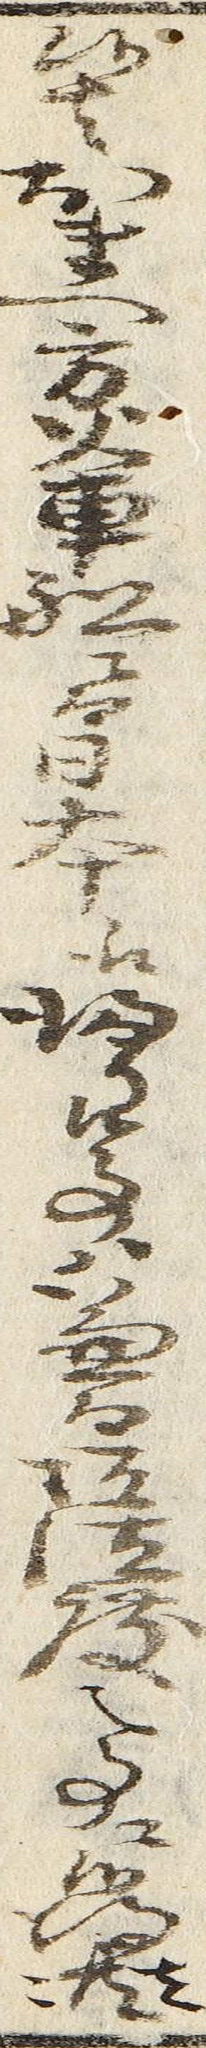候者おまへ方火車船に而日本国江帰り候事は兼而御法度之事に候得共
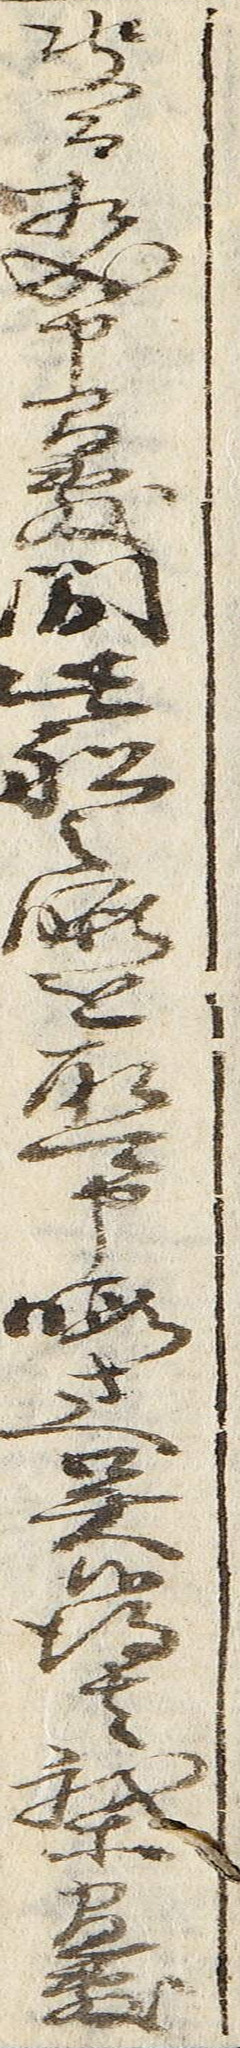決而相成申間敷間此船之暇を取可申暇さへ呉候得者我等宜敷
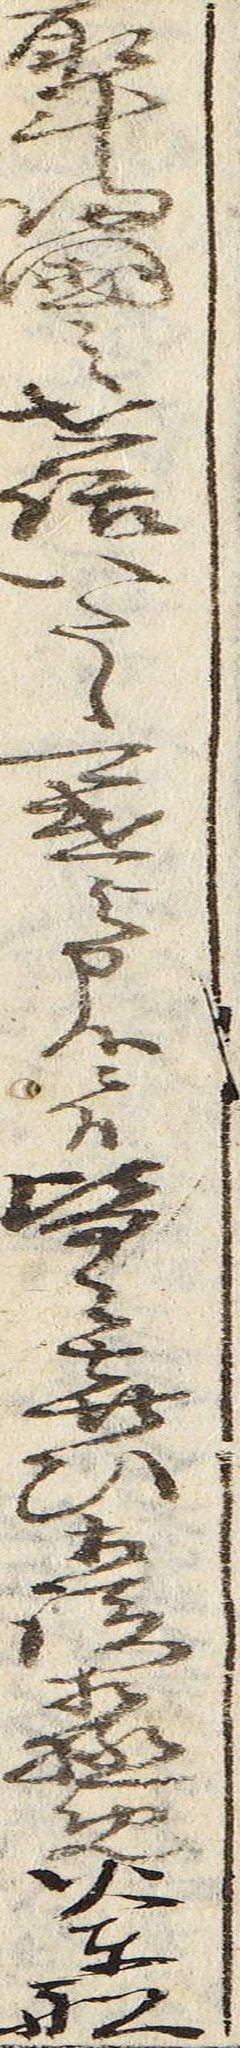取計帰国之世話いたし可遣と申候に付皆々喜ひ相談相極め火車船
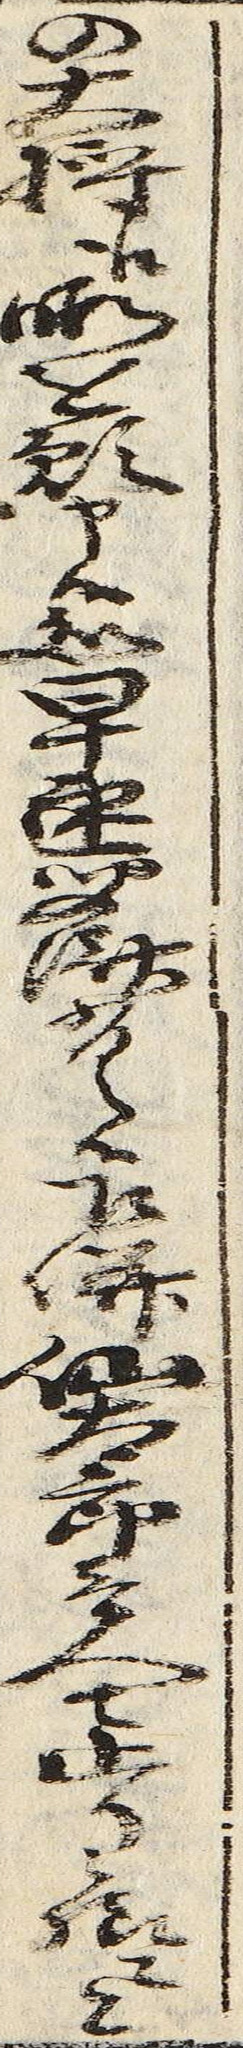の大将江暇を願申候処早速聞済有之候乍併仙太郎壱人者止り候様にと
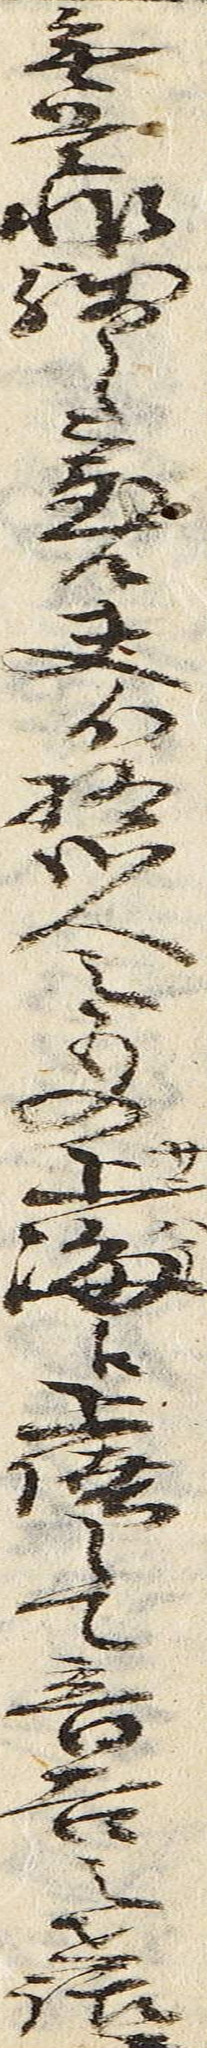無是非残し置候夫ゟ拾弐人之もの上海江上陸して音吉之世話に
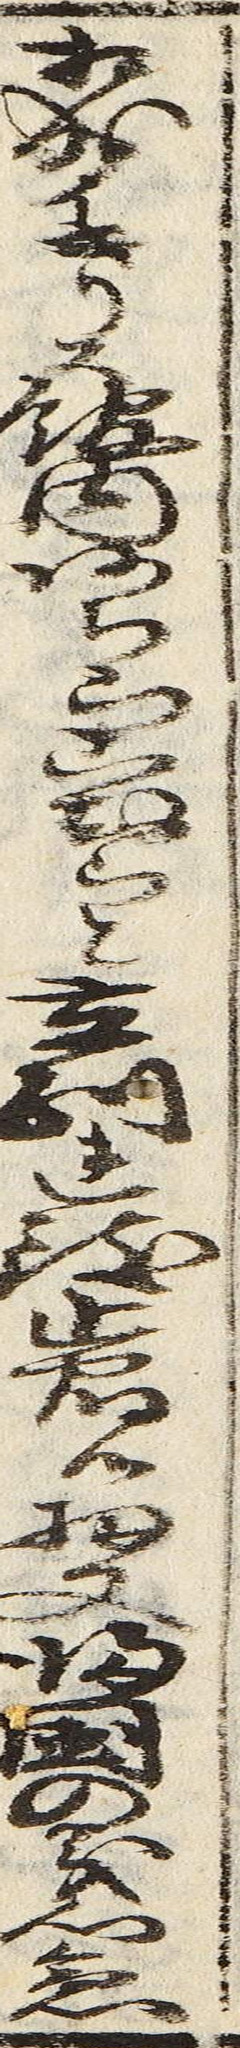相成イキリス館内あちらこちらと立別れ致止宿候扨又帰国の義心急
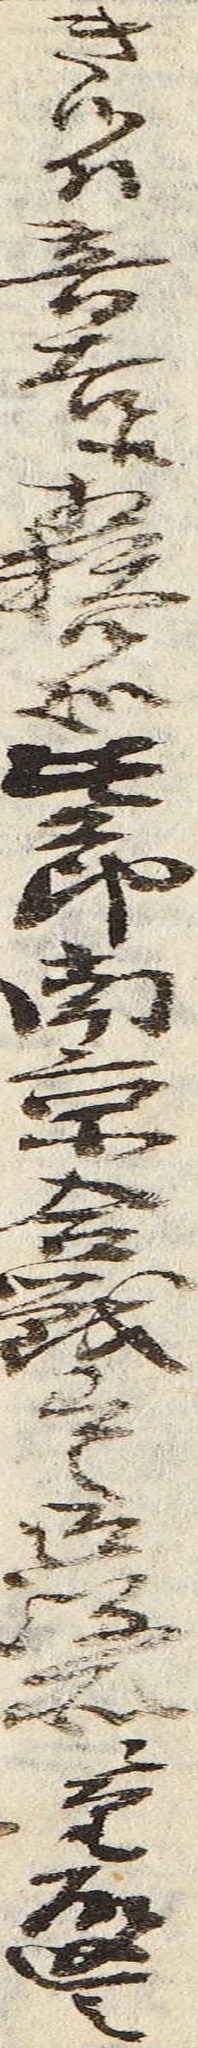き候付音吉江相候処此節南京合戦は御役所に而も取込と
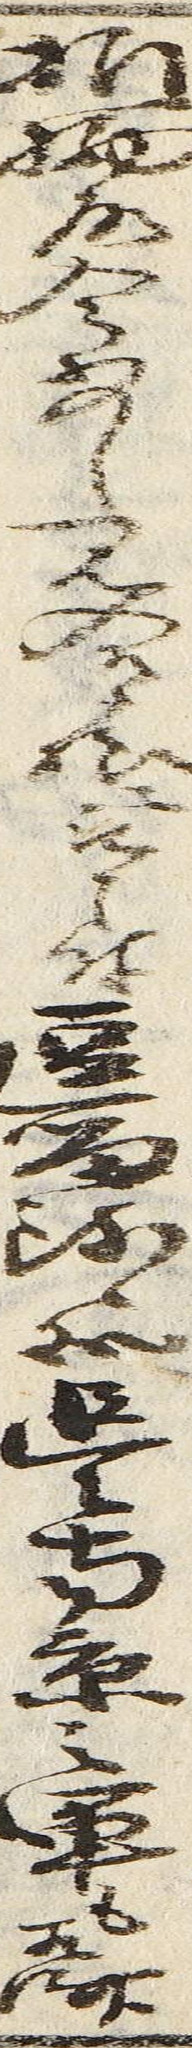折柄故今少し見合候様に被申付逗留致候処追々南京之軍も相済
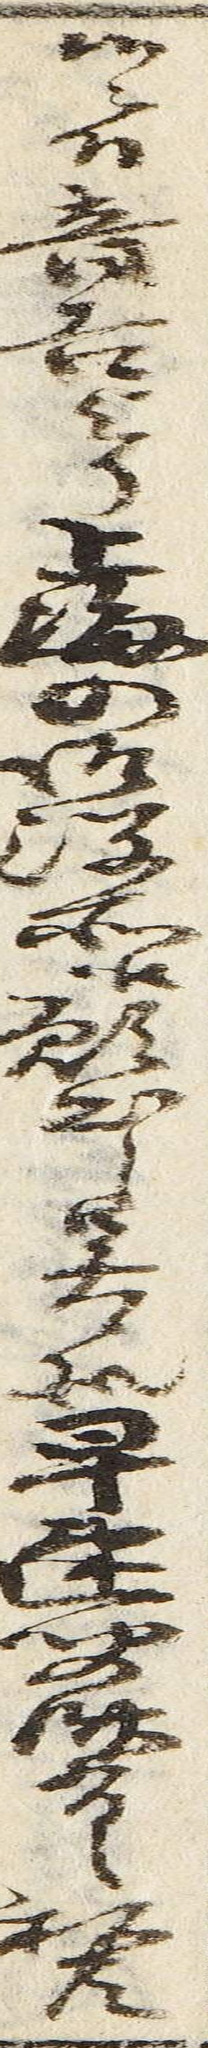候に付音吉より上海の御役所江願出し呉候処早速聞済有之私共
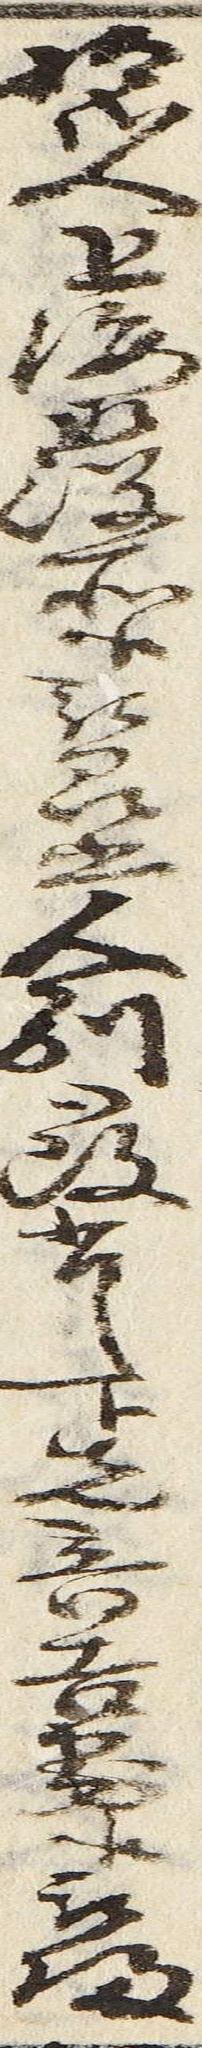拾弐人上海御役所江被召出人別御改有之一と先音吉宅江被帰
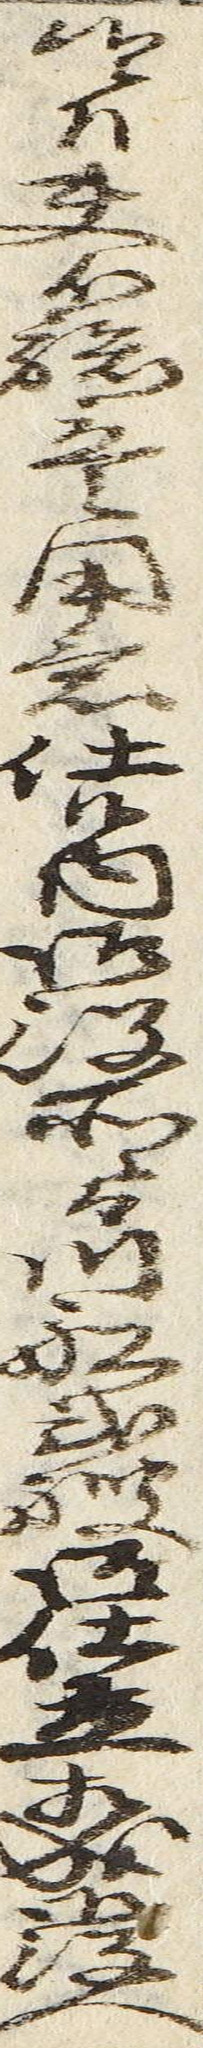候に付夫ゟ旅立之用意仕候内御役所に而川船弐艘御仕立相成御役人
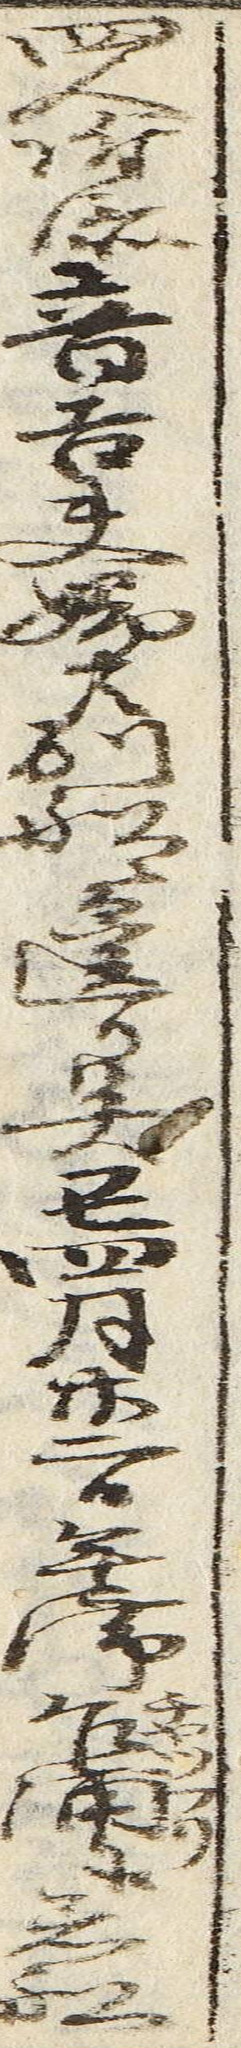四人附添音吉夫婦共別船に而送り呉丑四月廿二日無滞乍浦江着船
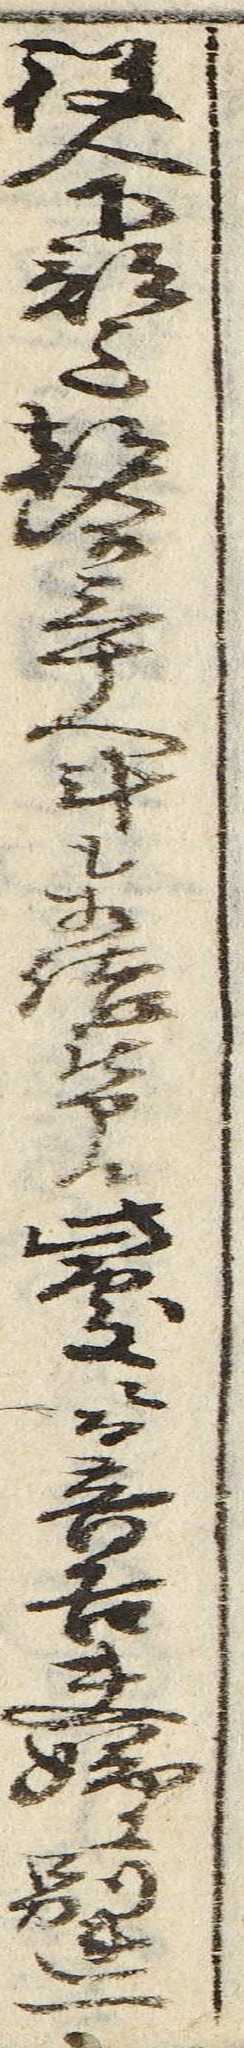役人下部迄都合三十人も相詰被申候此処に而音吉夫婦と別れ一

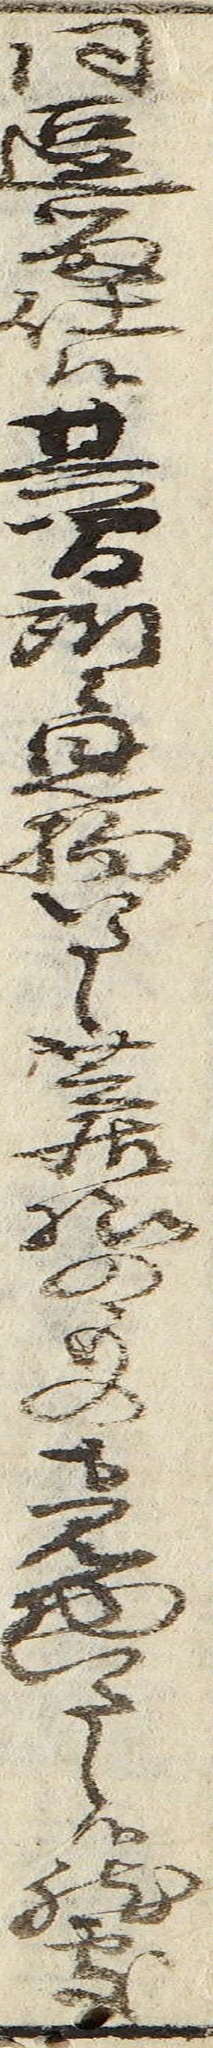同逗留仕候其間所々見物いたし芝居様のものも見物いたし候然処
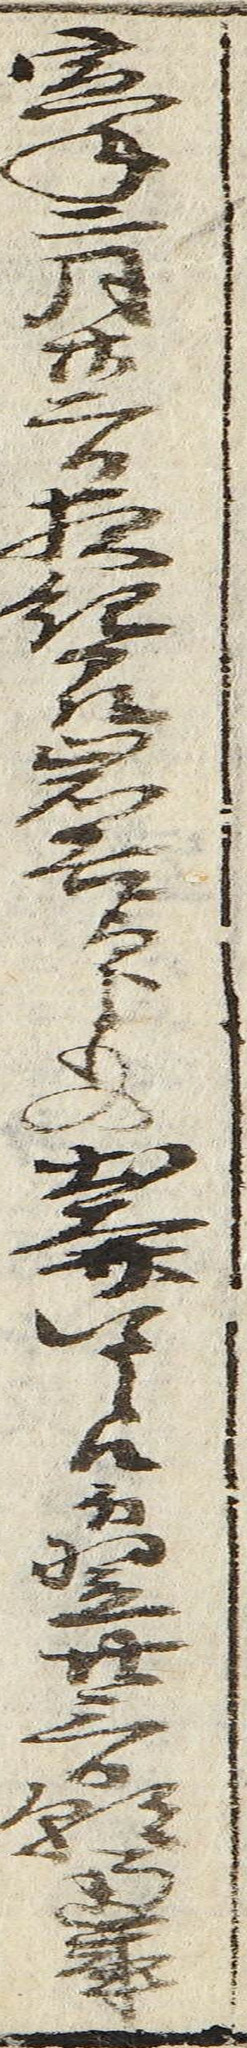寅年二月廿二日夜紀州岩吉と申もの出奔いたし候付廿三日朝通事
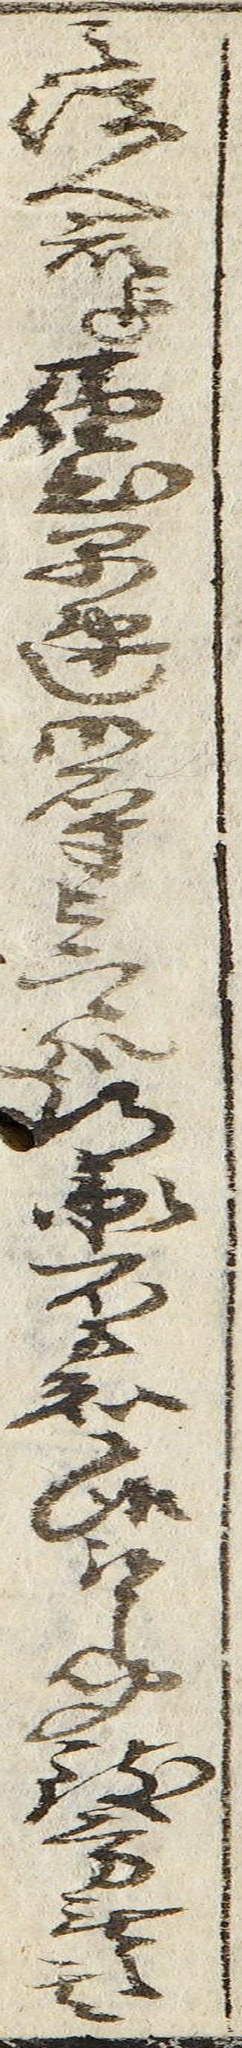之役人衆迄届出早速御尋被下候処行衛不相知趣被申聞致方無之其
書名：漂流夢物語
